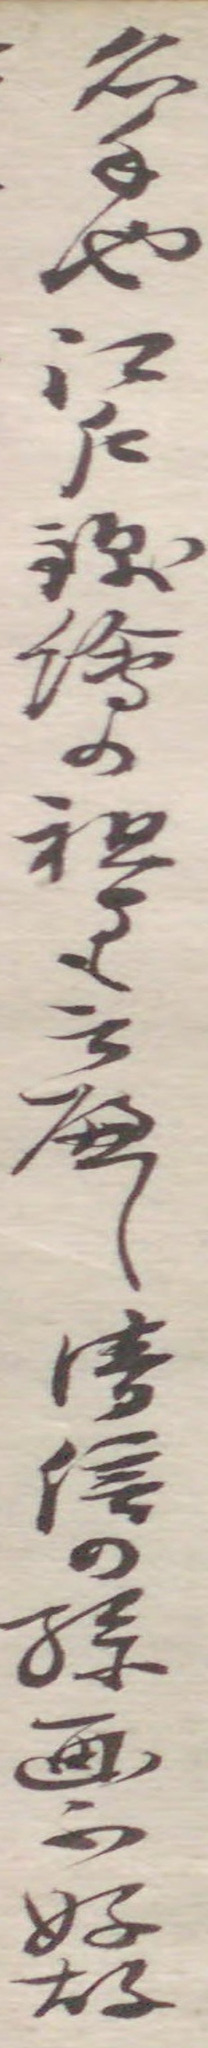名手也江戸錦絵の祖とも云へし清信の孫画不好故
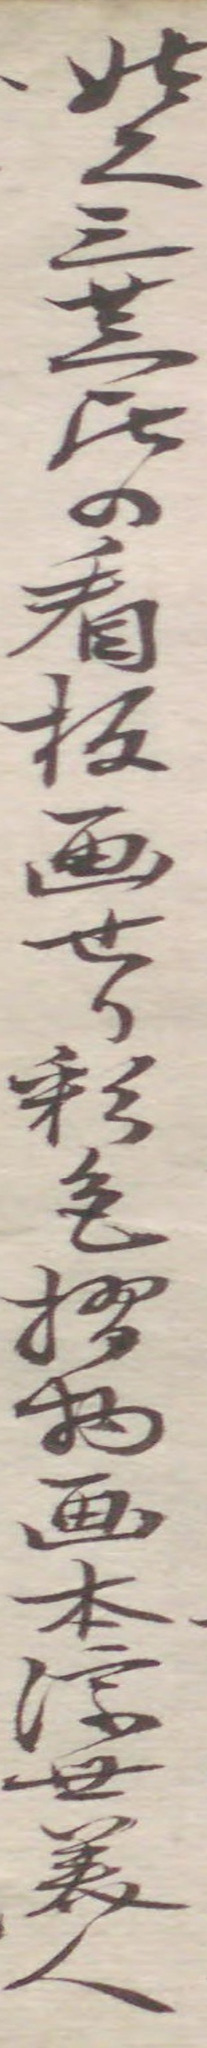姑く三芝居の看板画せり彩色摺物画本浮世美人
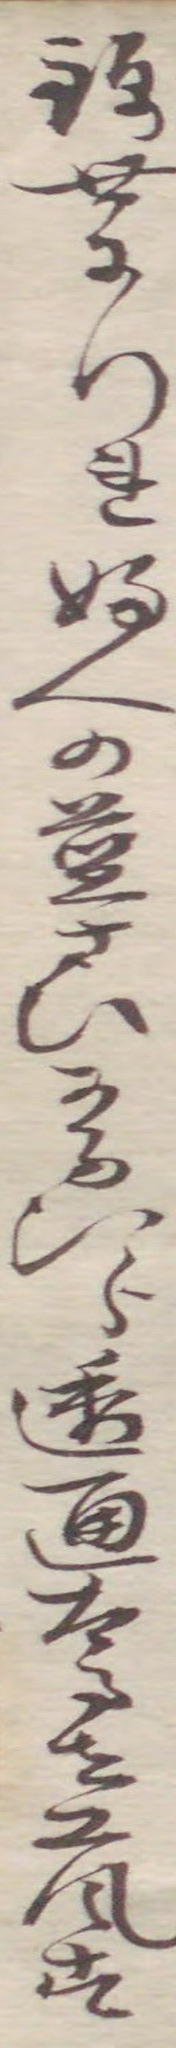錦世に行れ好人の藍さひかたひら透通たるを工夫す
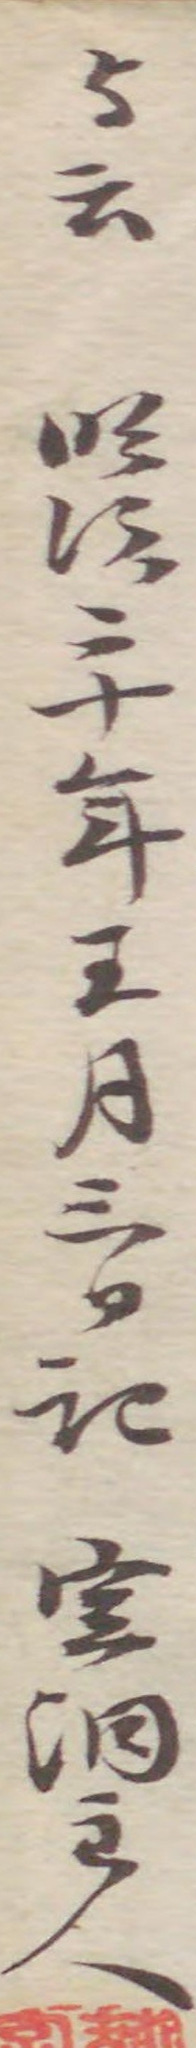と云明治二十年五月三日記定洞主人
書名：大通人穴[サガシ] 3巻
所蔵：国立国会図書館 National Diet Library, JAPAN
